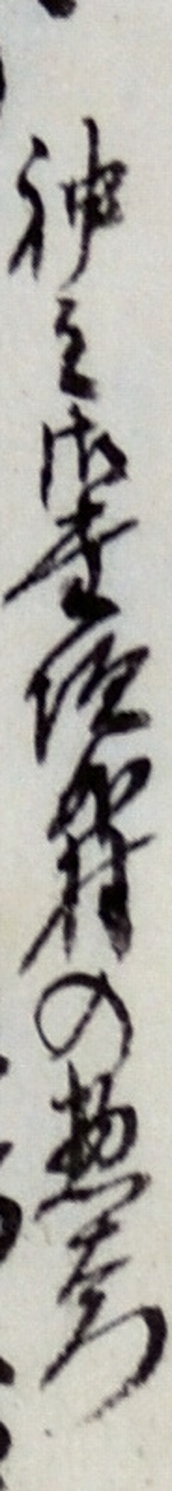神主御堂垣外村の惣右衛門
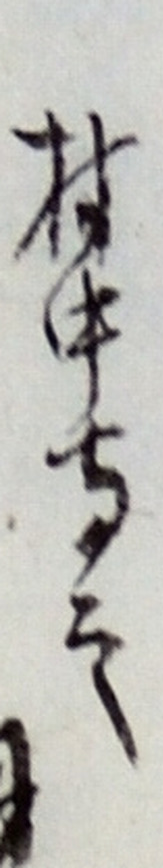村中守之
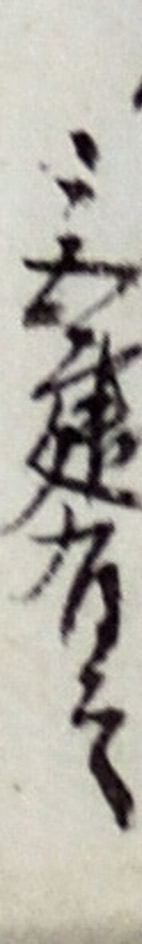宮建有之
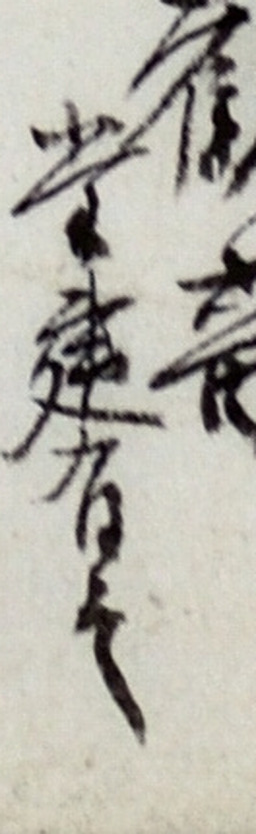堂建有之
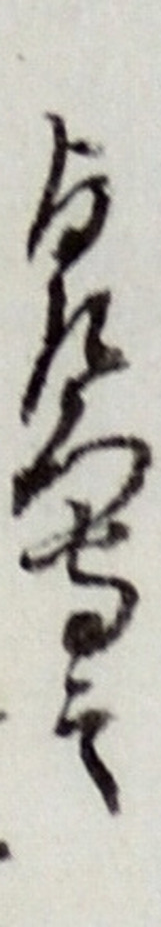与左衛門守之
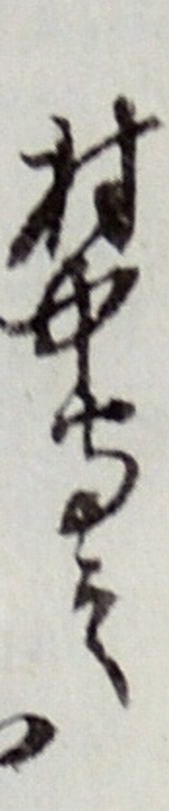村中守之
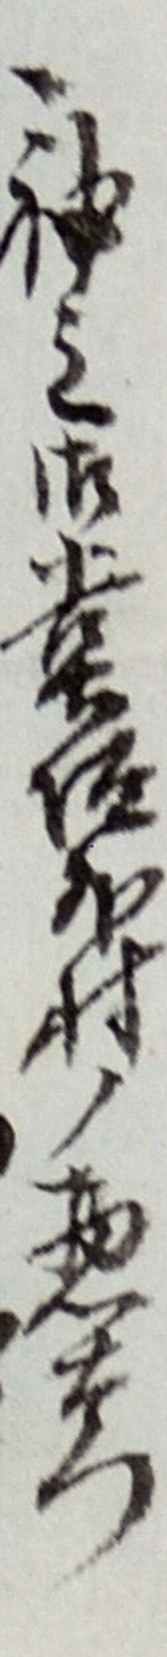神主御堂垣外村ノ惣右衛門
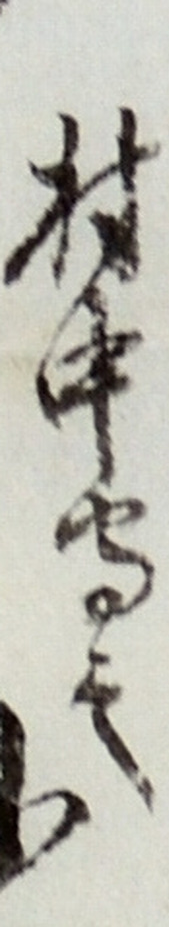村中守之
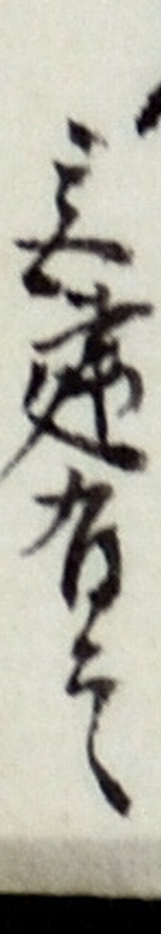宮建有之
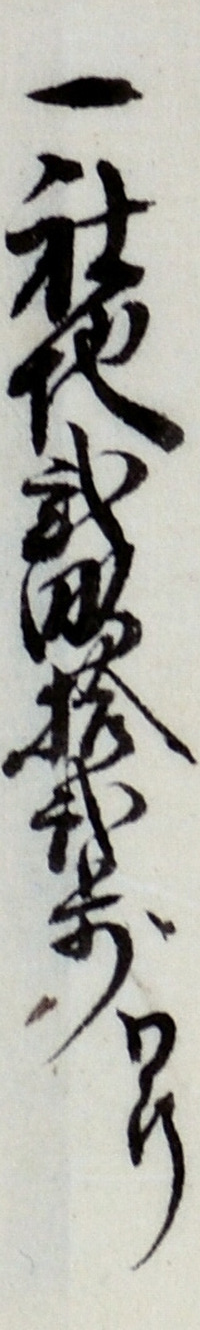一社地弐畝拾弐歩山神
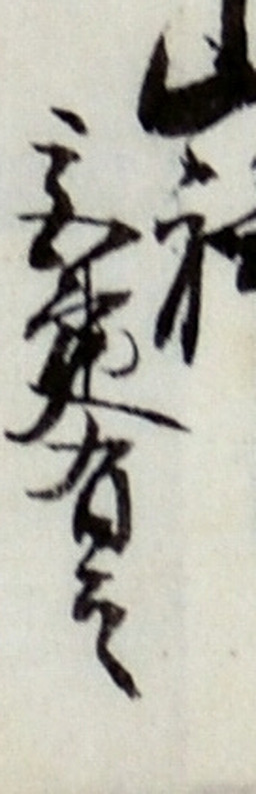宮建有之
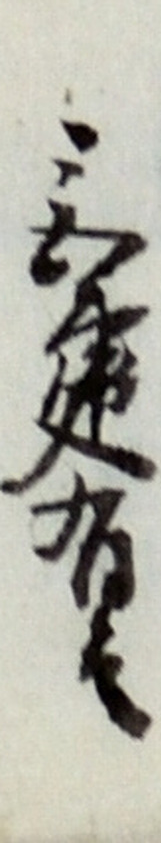宮建有之
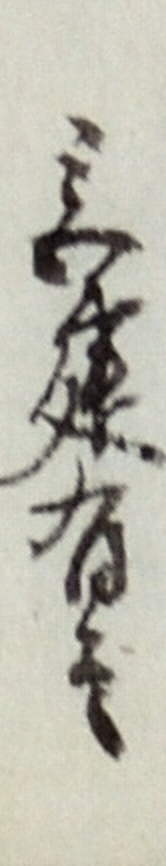宮建有之
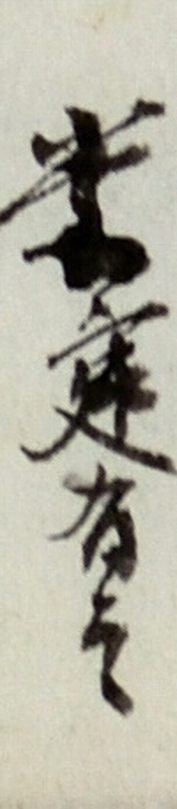宮建有之
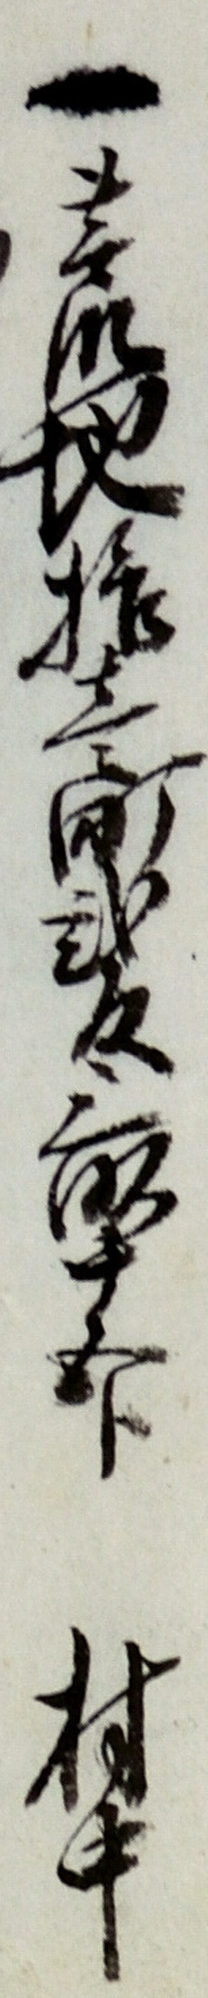一荒地拾壱調町弐反三畝十五歩村中
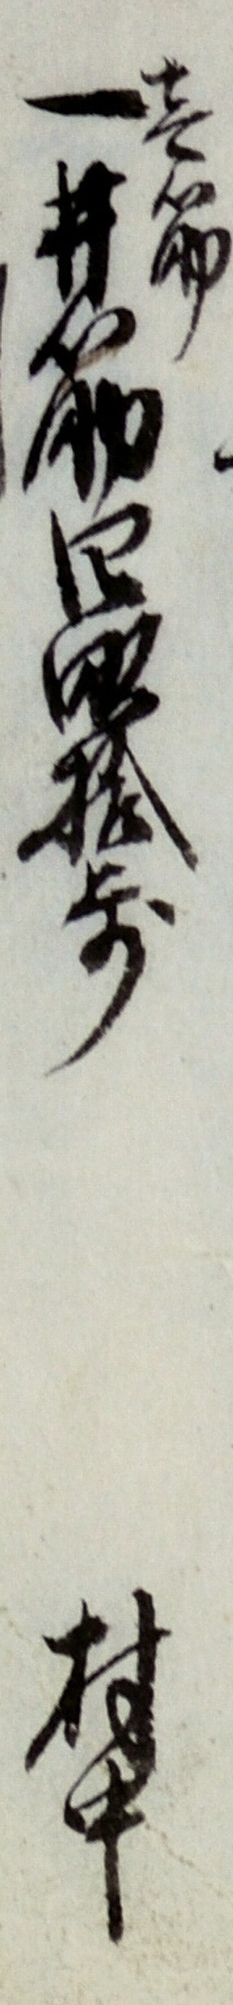一井筋四畝拾歩村中
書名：御領分中山林社地手控
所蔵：伊那市立高遠町図書館・合同会社AMANE
